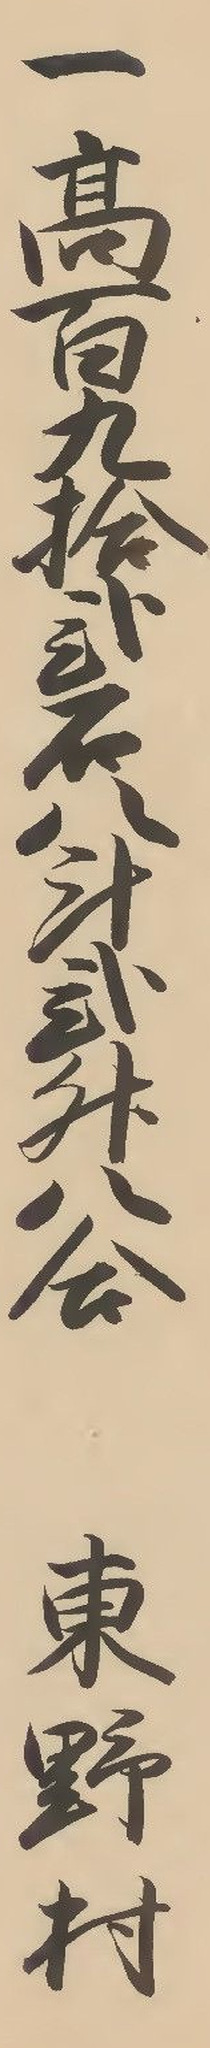一高百九拾弐石八斗弐升八合東野村
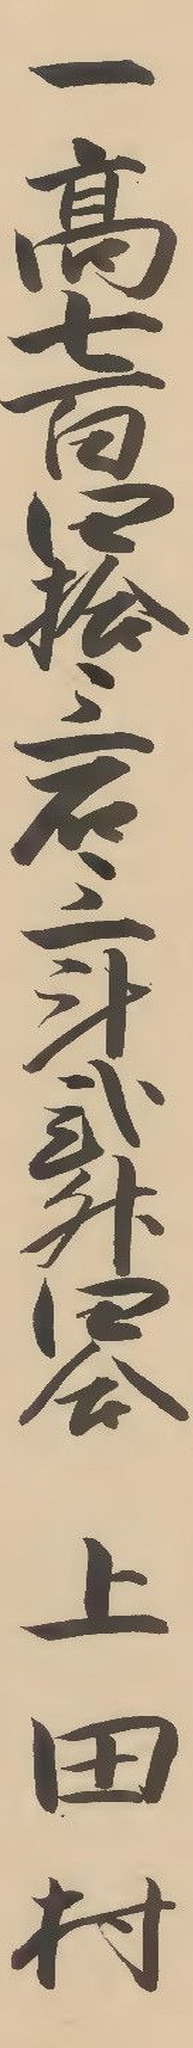一高七百四拾三石三斗弐升四合上田村
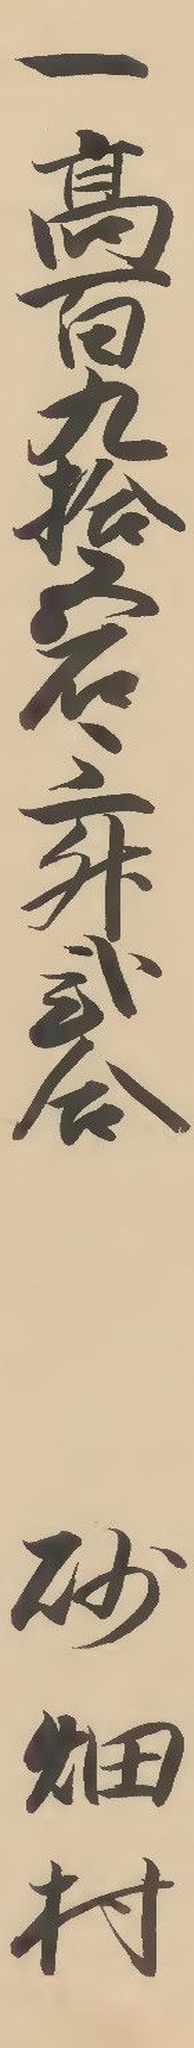一高百九拾五石三升弐合砂畑村

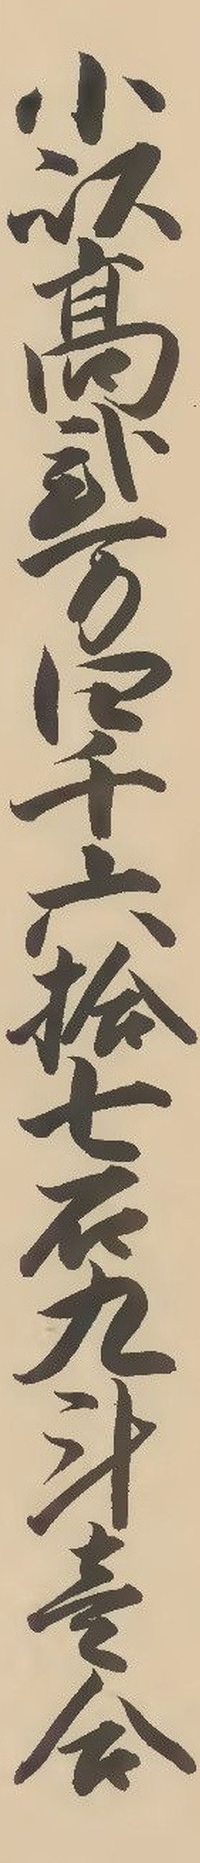小以高弐万四千六拾七石九斗壱合
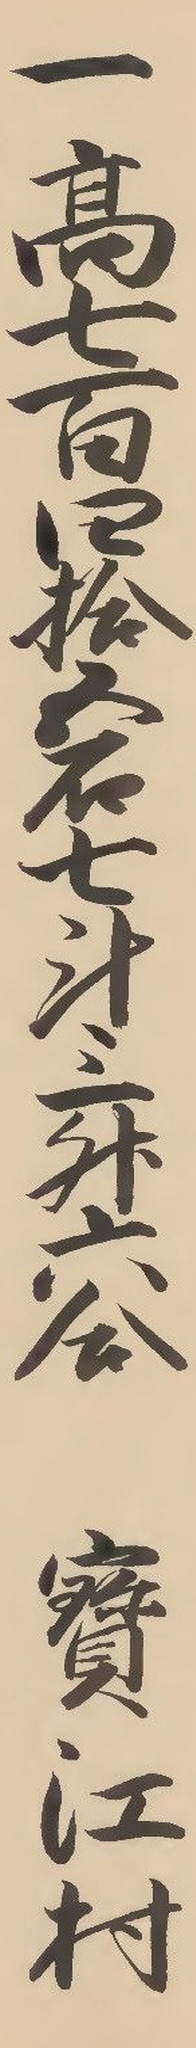一高七百四拾五石七斗三升六合宝江村
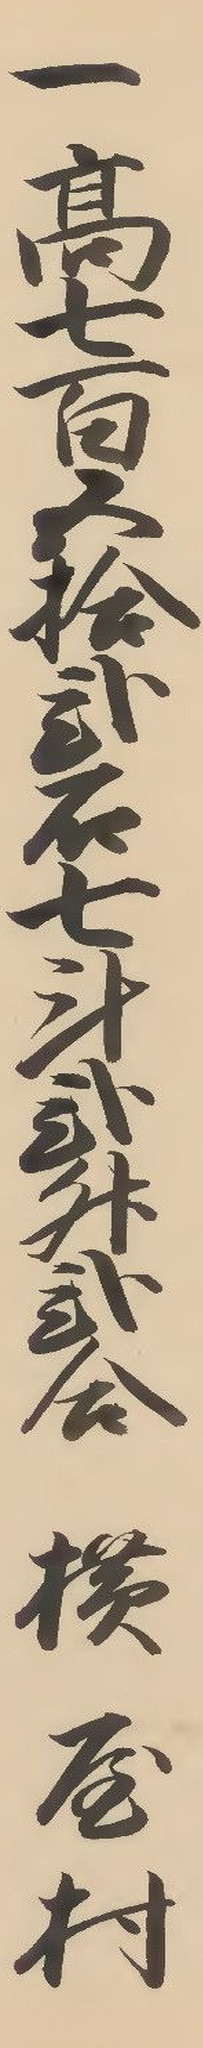一高七百五拾弐石七斗弐升弐合横屋村
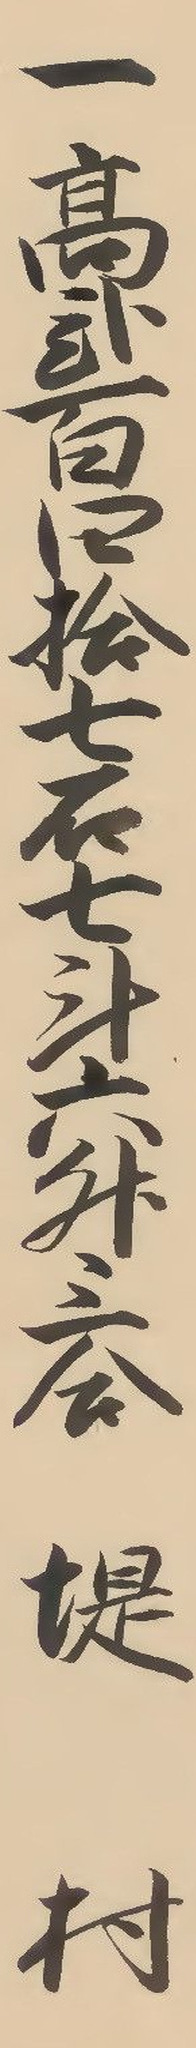一高弐百四拾七石七斗六升三合堤村

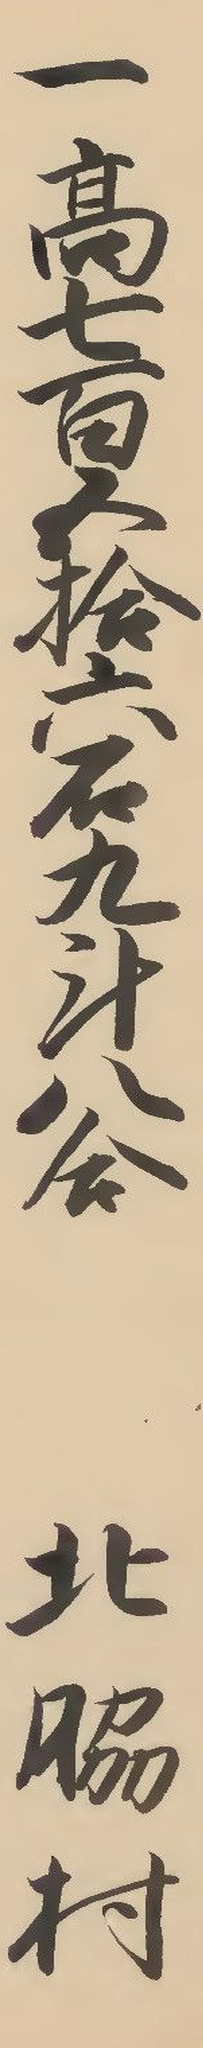一高七百五拾六石九斗八合北脇村
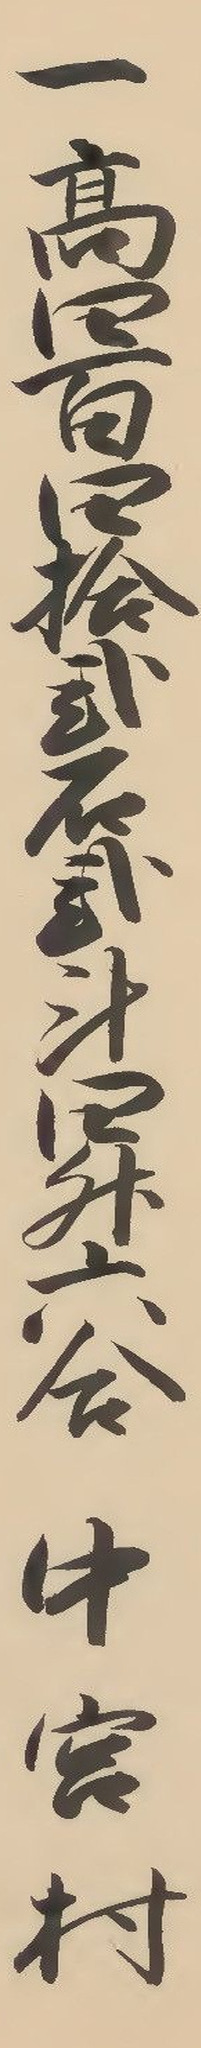一高四百四拾弐石弐斗四升六合中宮村
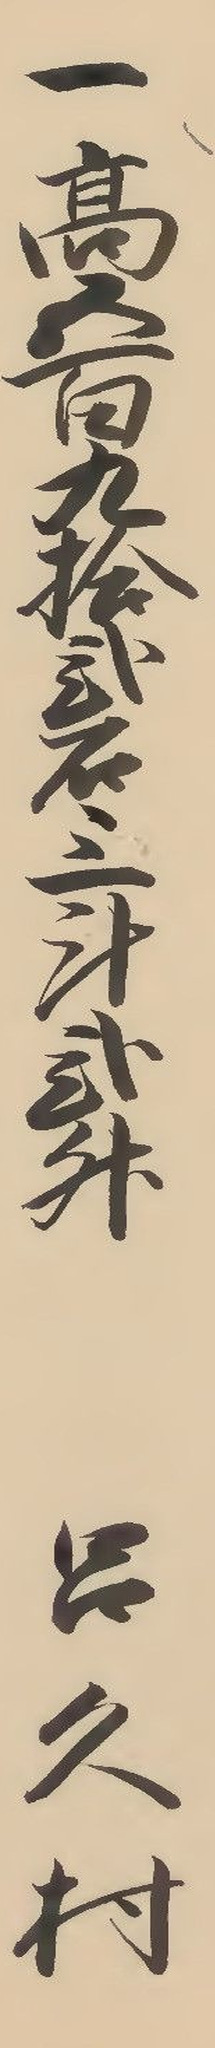一高五百九拾弐石三斗弐升呂久村
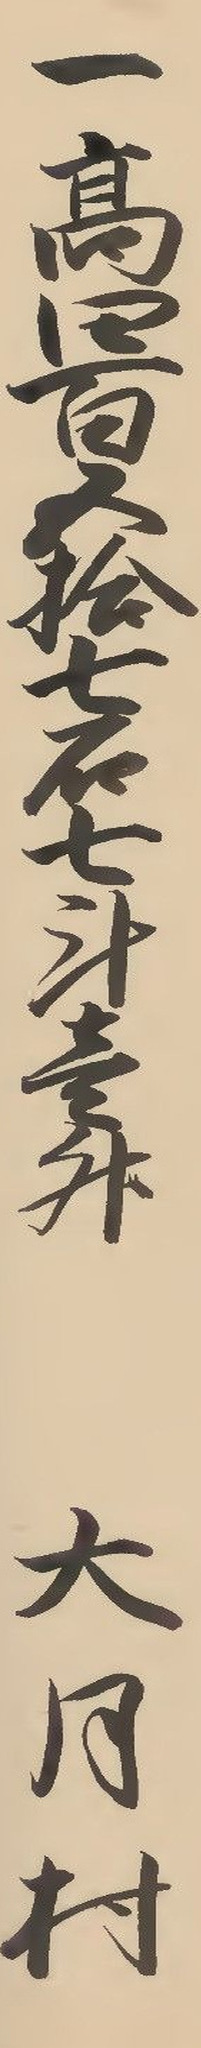一高四百五拾七石七斗壱升大月村
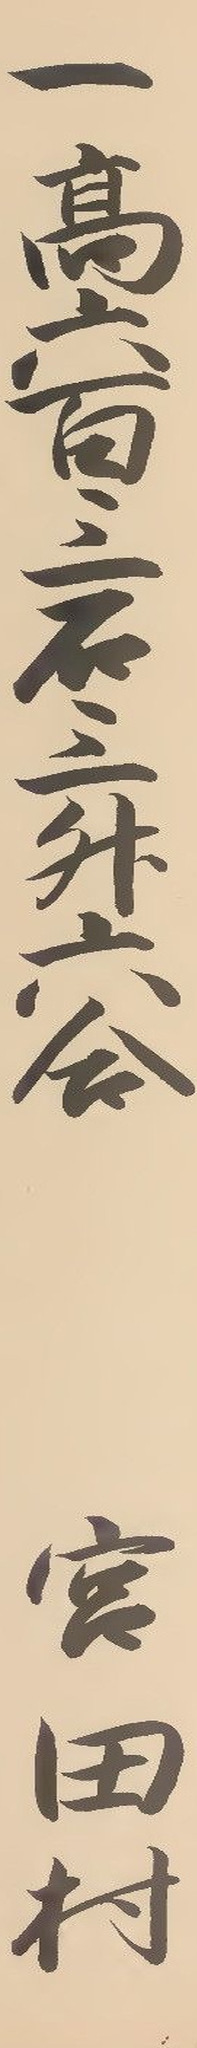一高六百三石三升六合宮田村
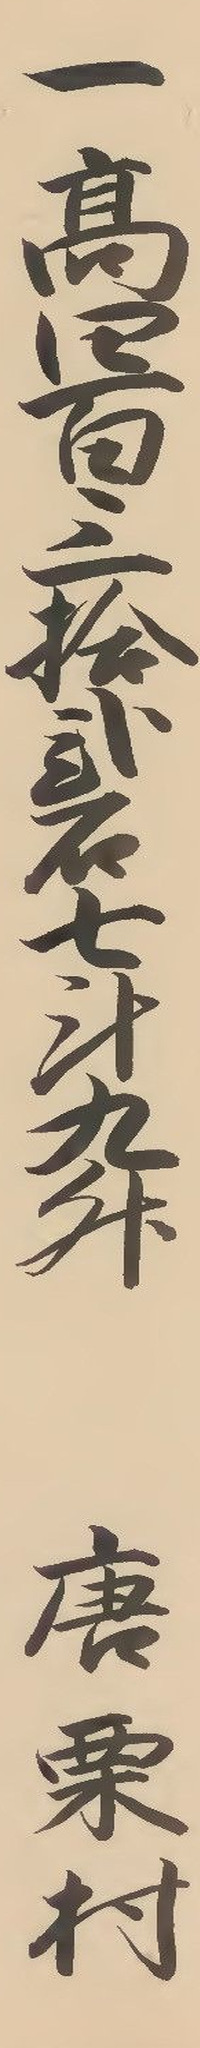一高四百三拾弐石七斗九升唐栗村
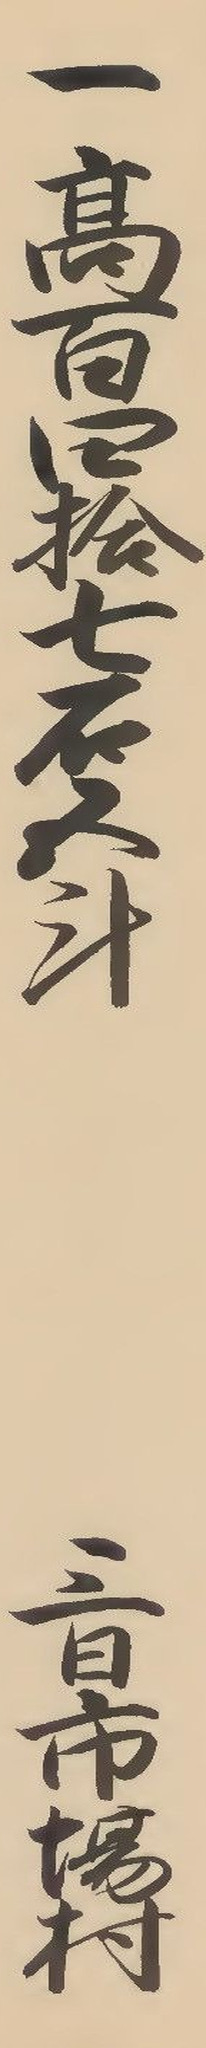一高百四拾七石五斗三日市場村
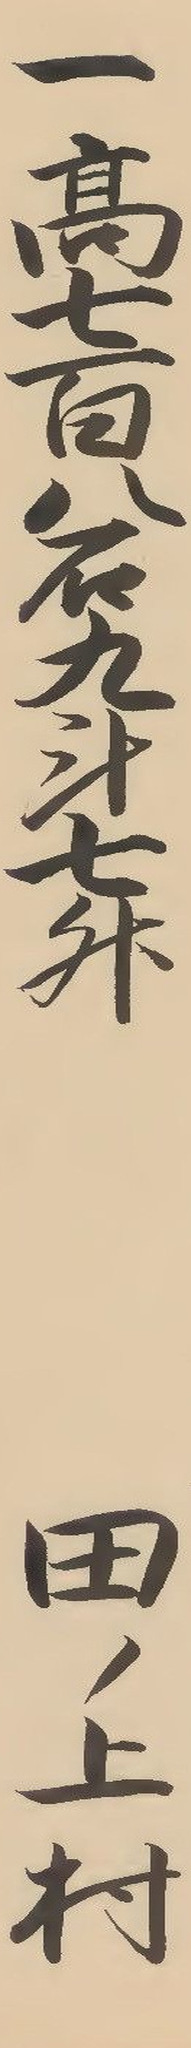一高七百八石九斗七升田ノ上村

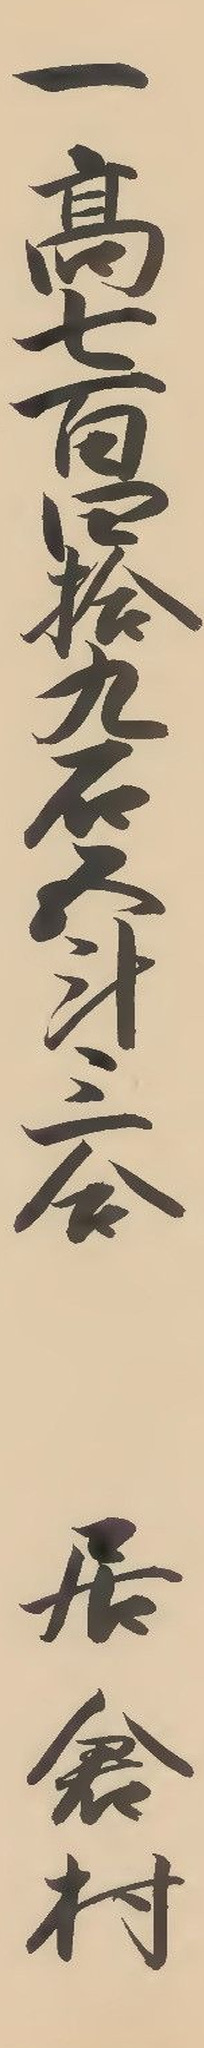一高七百四拾九石五斗三合居倉村
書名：美濃国郷帳
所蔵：国立公文書館 National Archives of Japan
